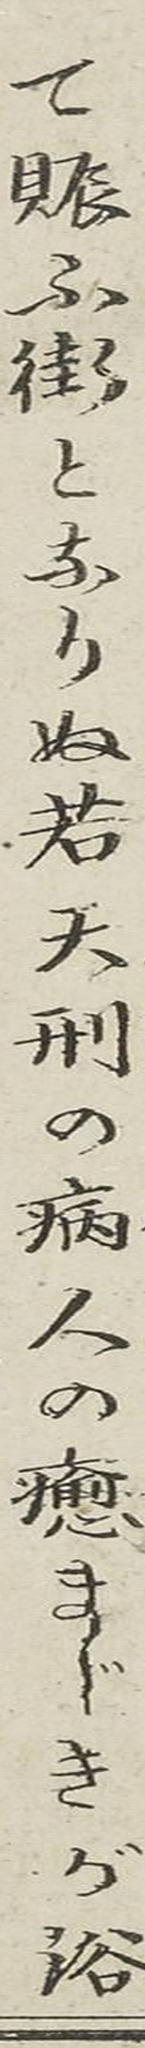て賑ふ街となりぬ若天刑の病人の癒まじきが浴
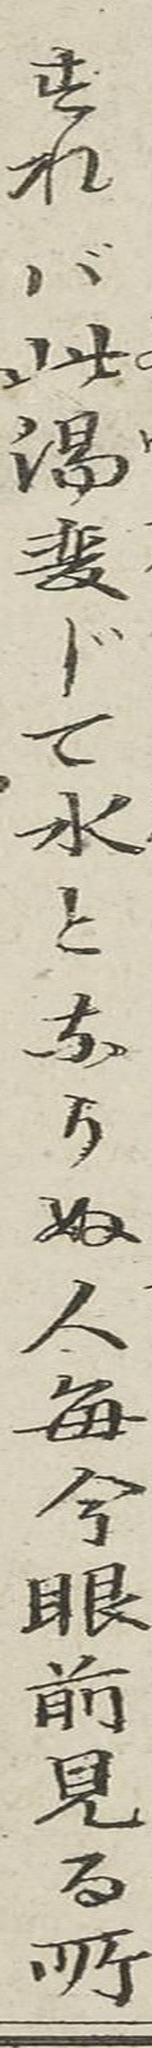すれば此湯変じて水となりぬ人毎今眼前見る所

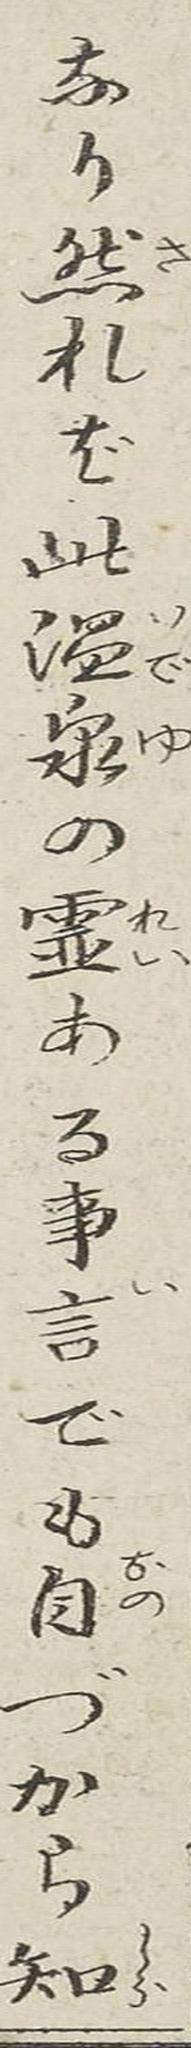なり然れば此温泉の霊ある事言でも自づから知
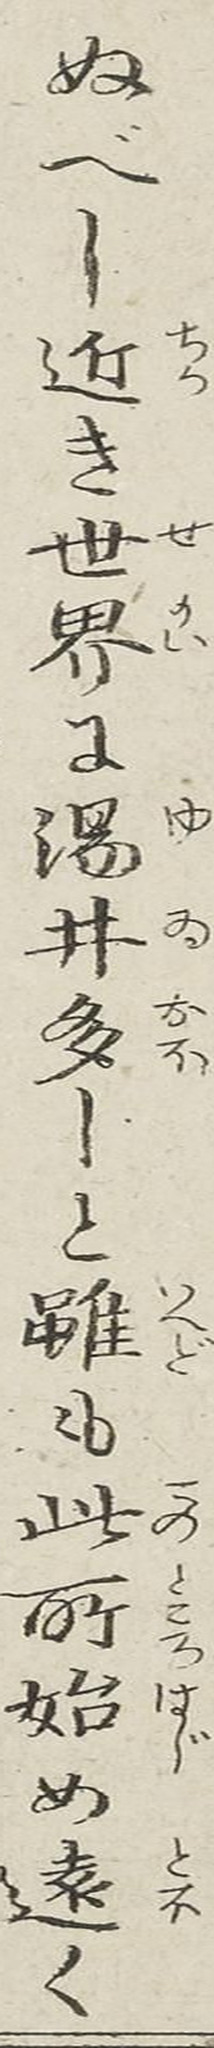ぬべし近き世界に湯井多しと雖も此所始め遠く
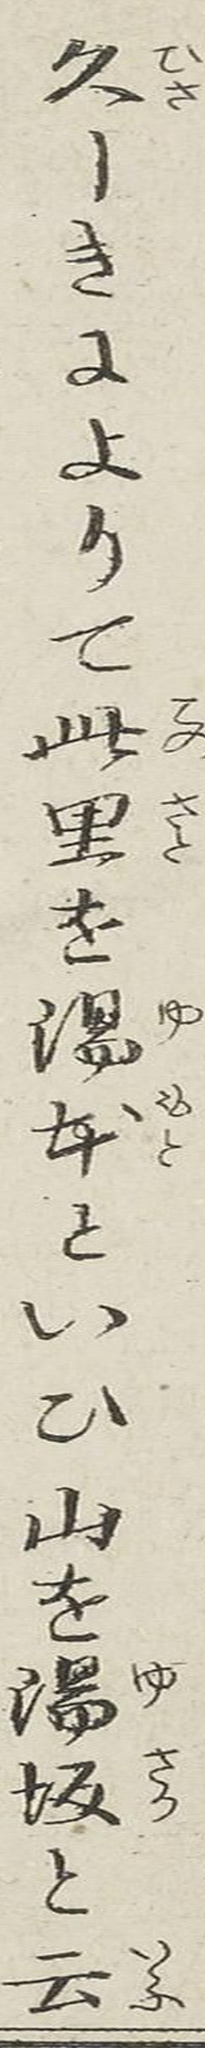久しきによりて此里を湯本といひ山を湯坂と云
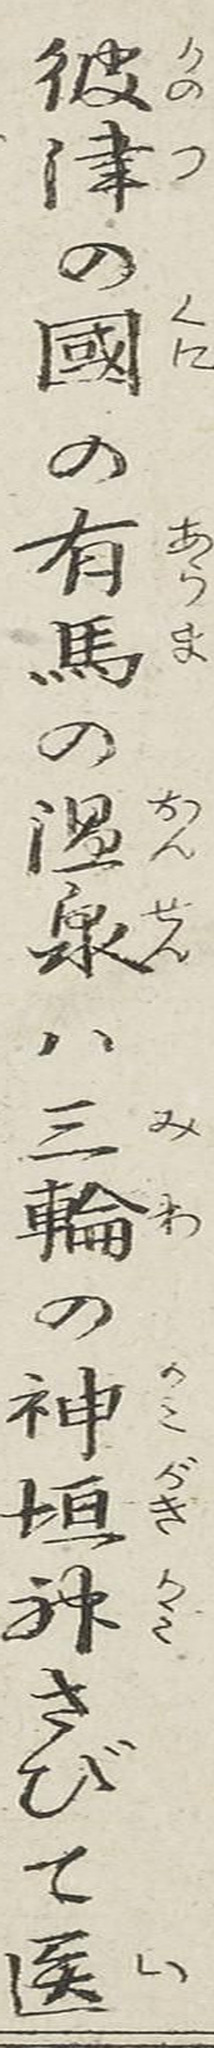彼津の國の有馬の温泉は三輪の神垣神さびて医
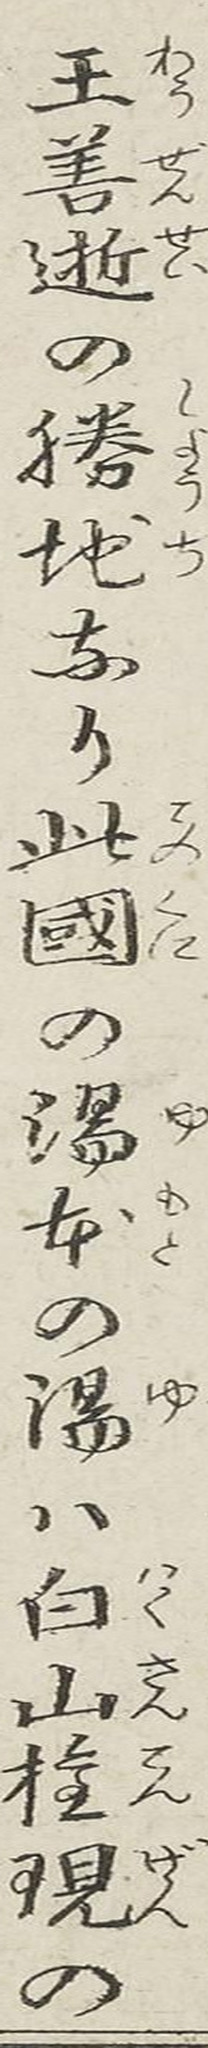王善逝の勝地なり此國の湯本の湯は白山権現の
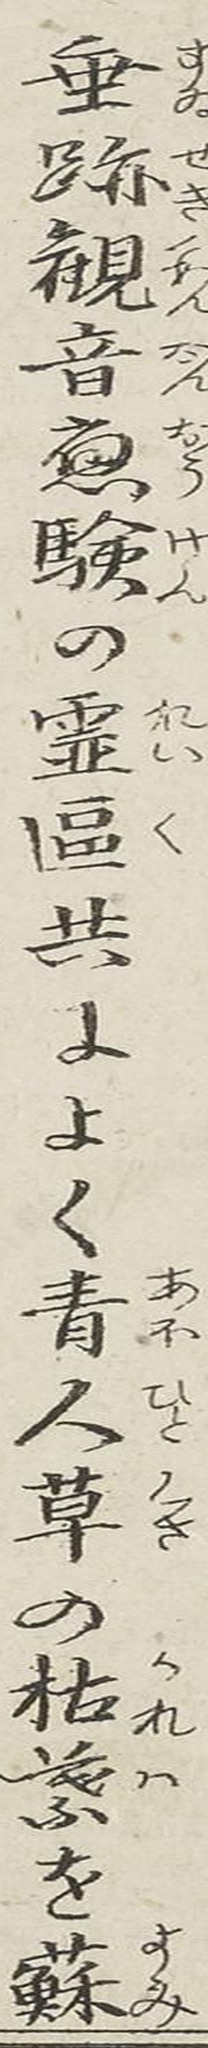垂跡観音応験の霊区共によく青人草の枯葉を蘇
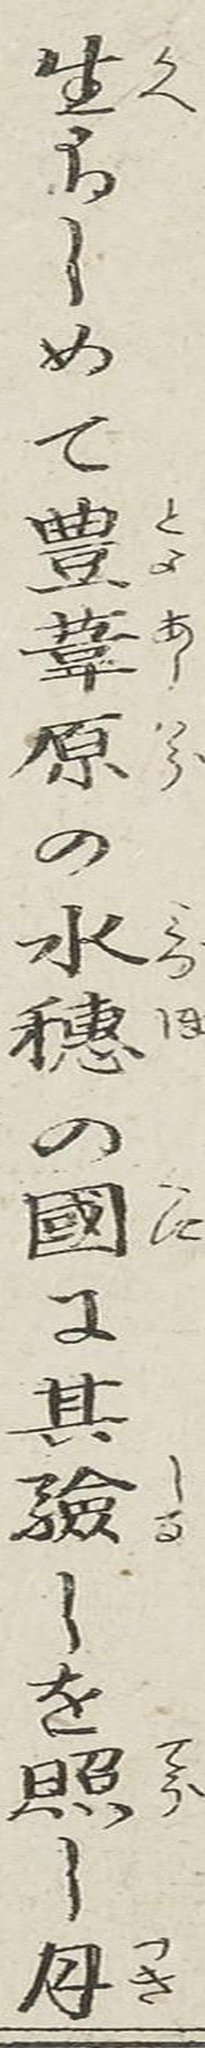生らしめて豊葦原の水穂の國に其験しを照し月
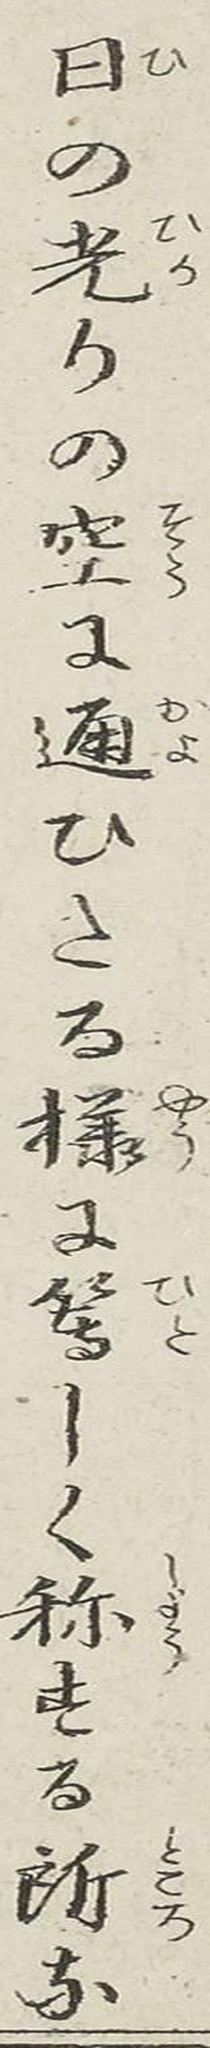日の光りの空に通ひたる様に等しく称する所な
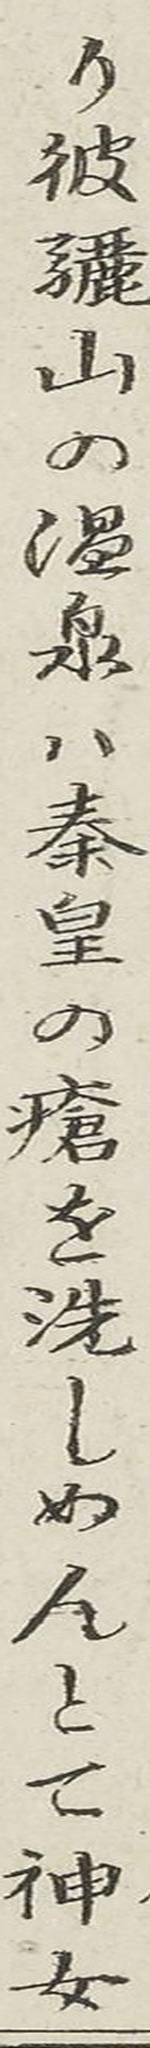り彼驪山の温泉は秦皇の瘡を洗しめんとて神女
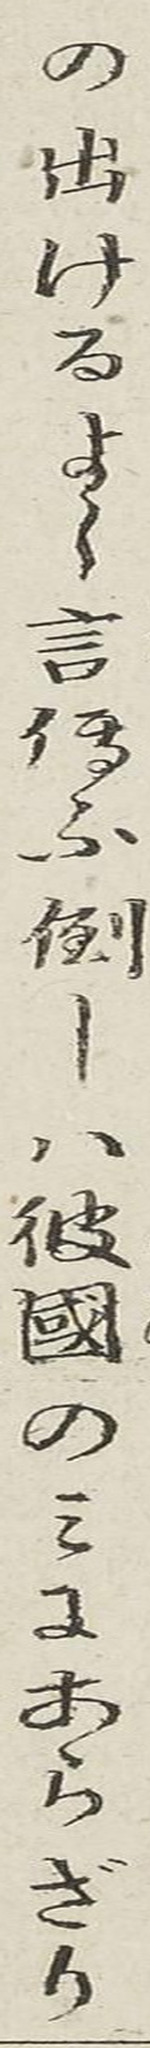の出けるよし言伝ふ例しは彼國のみにあらざり
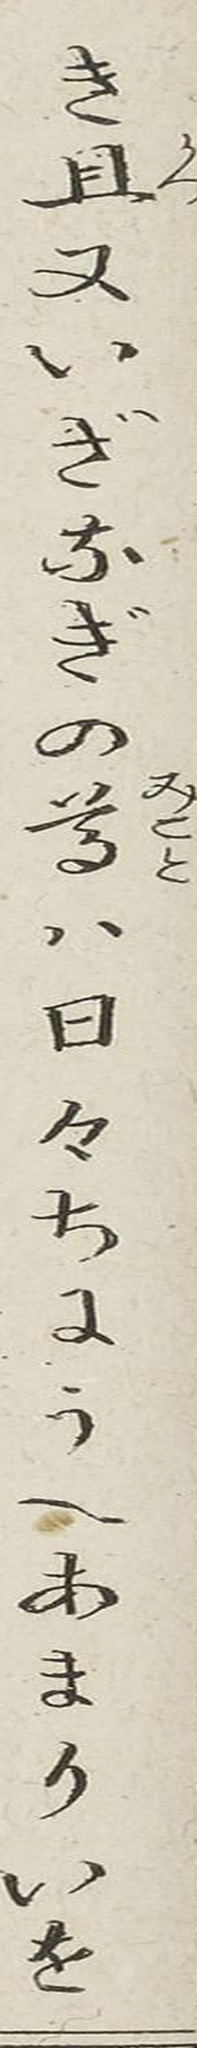き且又いざなぎの尊は日々ちにうへあまりいを
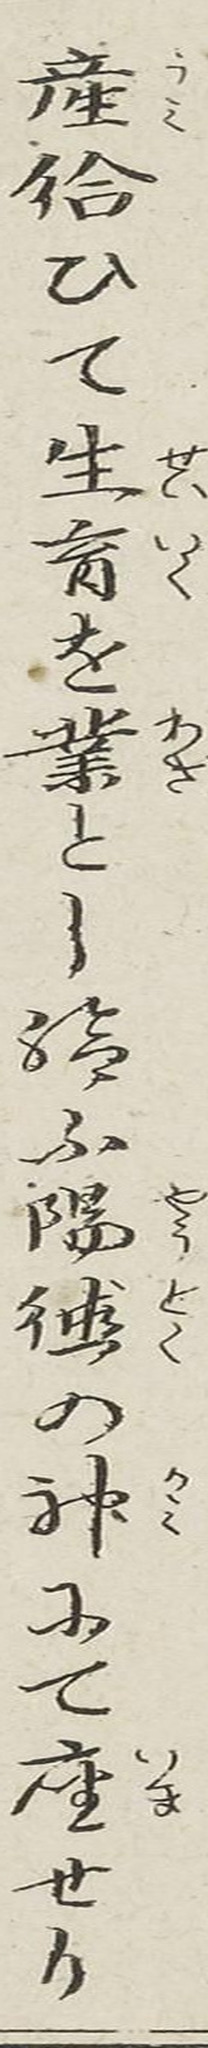産給ひて生育を業とし給ふ陽徳の神にて座せり
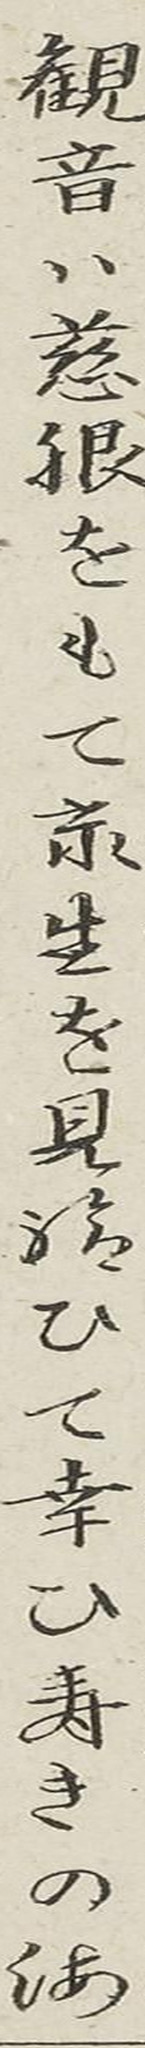観音は慈眼をもて衆生を見給ひて幸ひ寿きの海
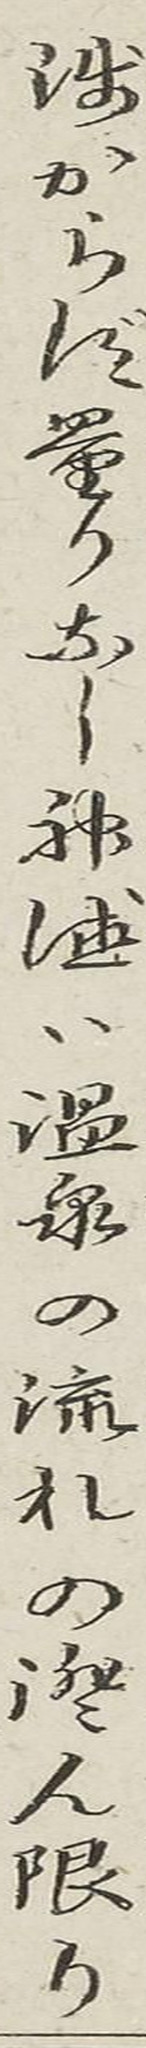浅からず量りなし神徳は温泉の流れの澄ん限り
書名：箱根温泉誌　全
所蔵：東京大学地震研究所図書室 Earthquake Research Institute Library, The University of Tokyo, JAPAN
